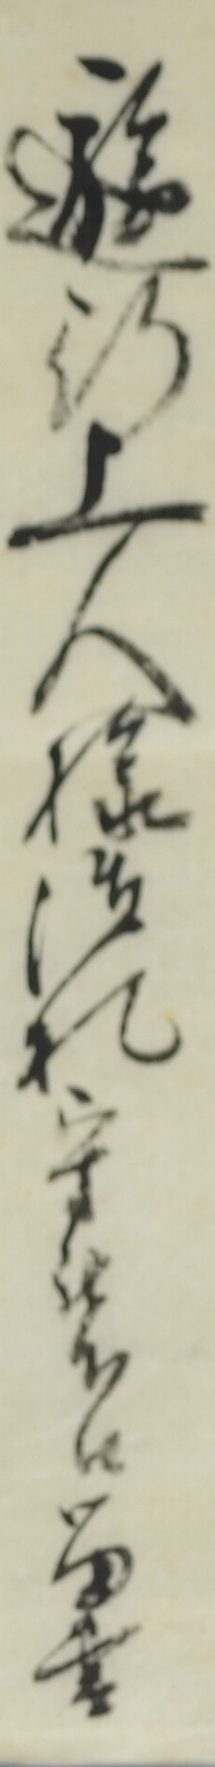遊行上人様御札守被下候留書

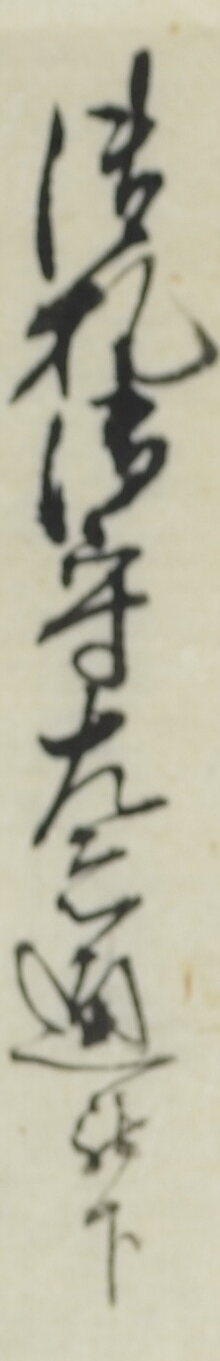御札御守左之通被下
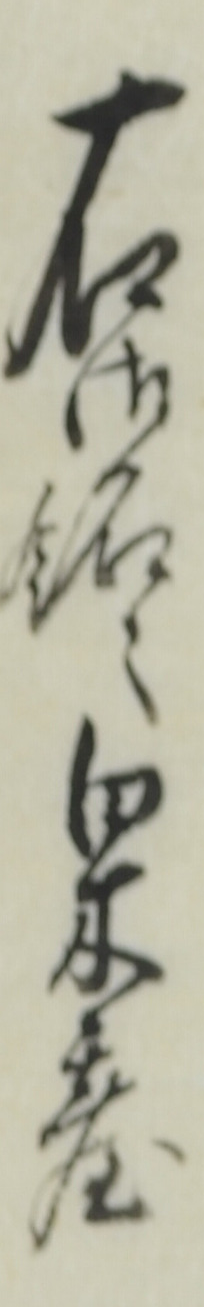右御銘々白木台
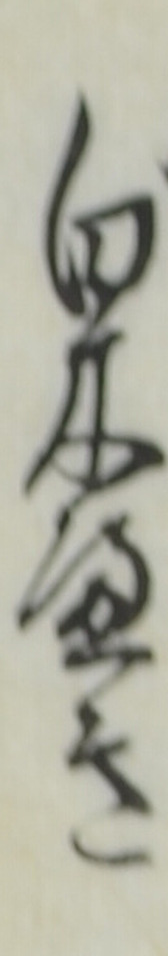白木へき

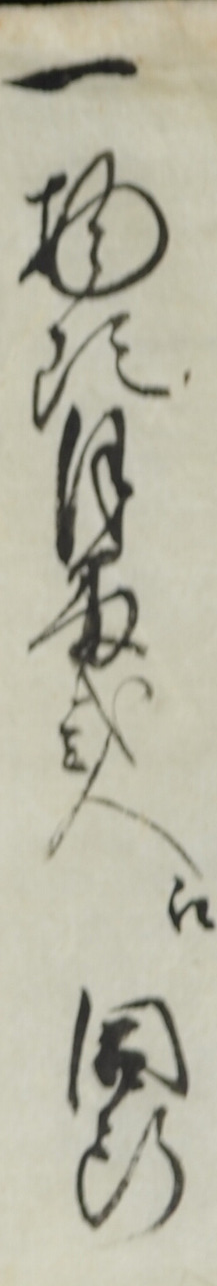一物頭月番弐人江同断
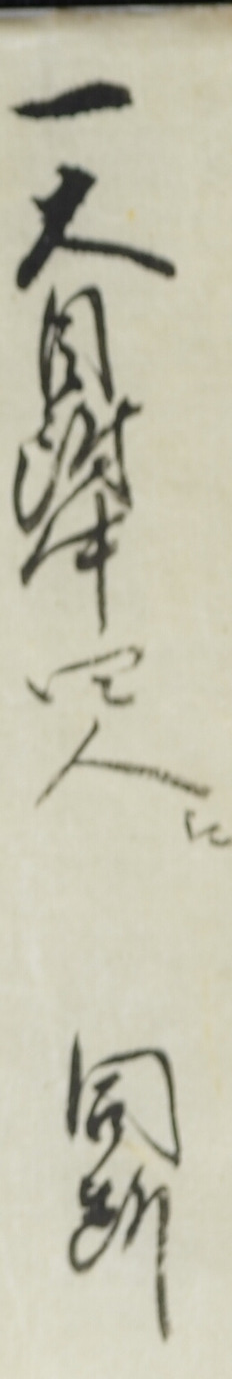一大目附中四人江同断
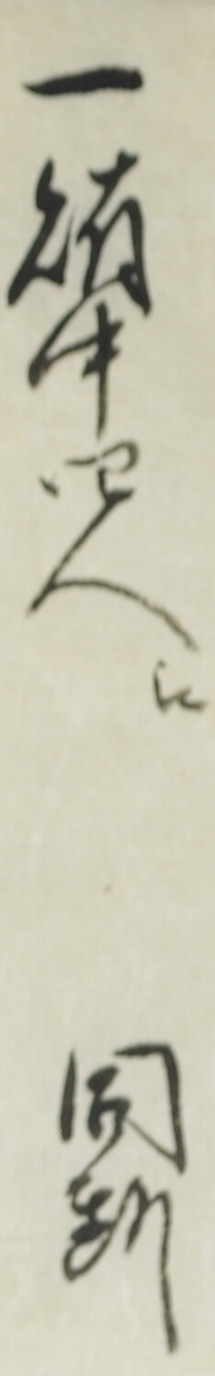一賄中四人江同断
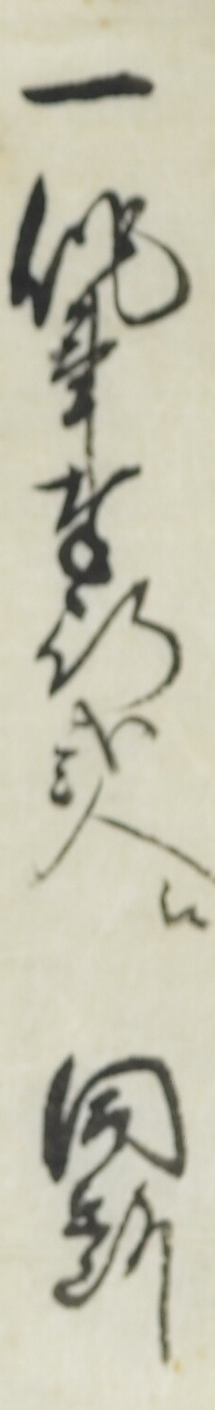一作事奉行弐人江同断
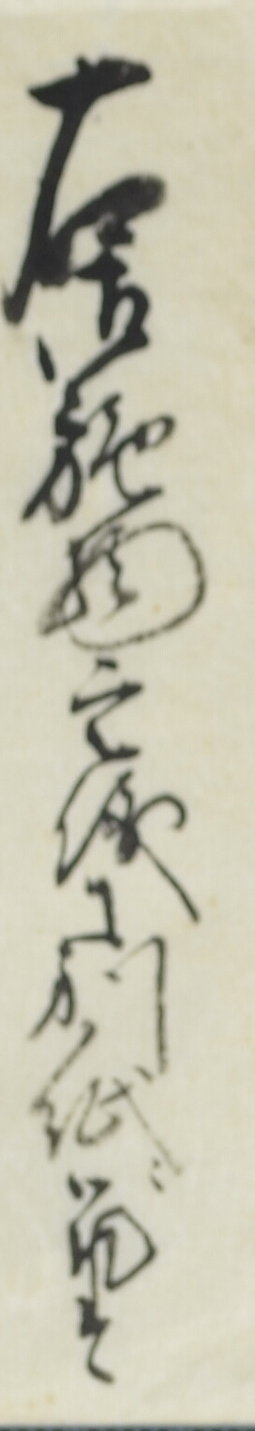右御施物之儀之別紙ニ記す
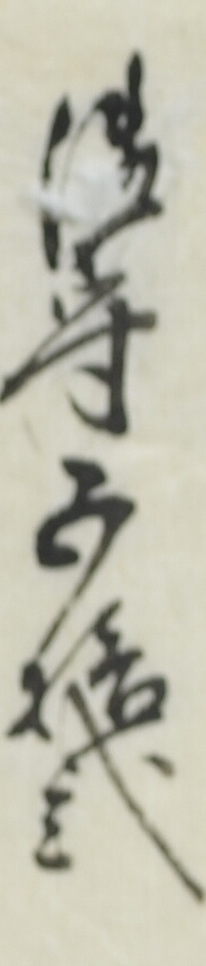御守五拾弐
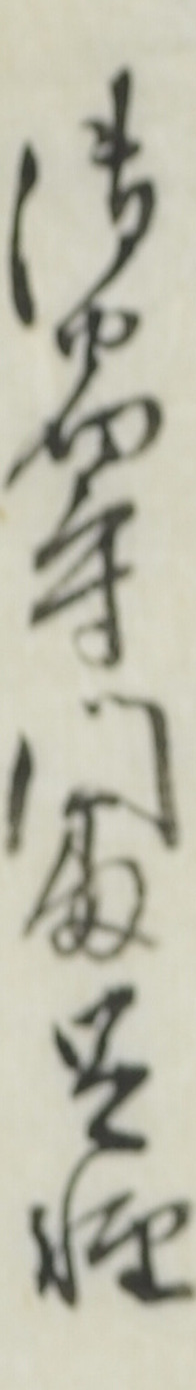御宿守門番足軽
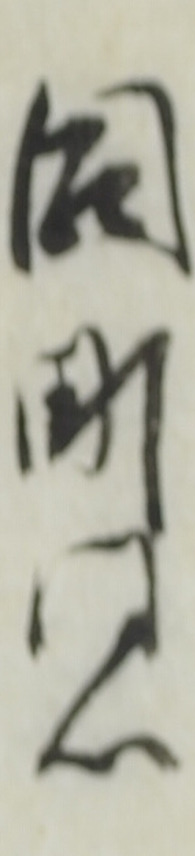同町同心
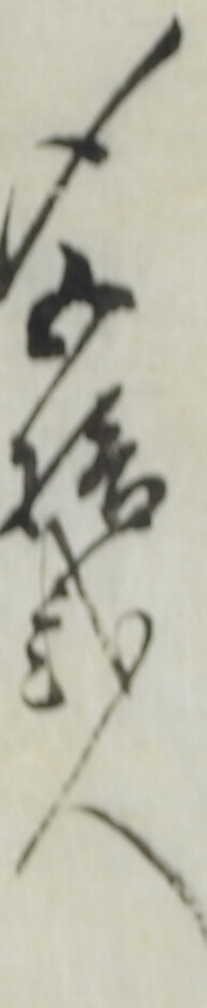〆五拾弐人

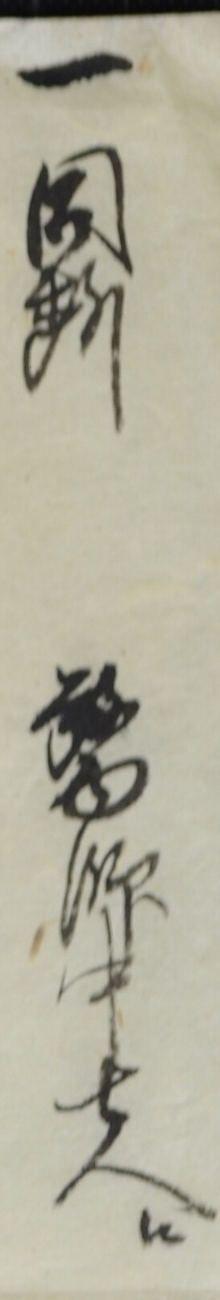一同断医師中七人江
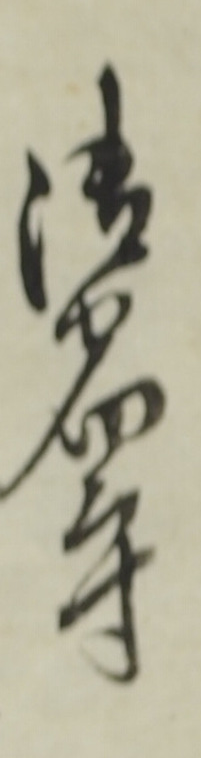御宿守
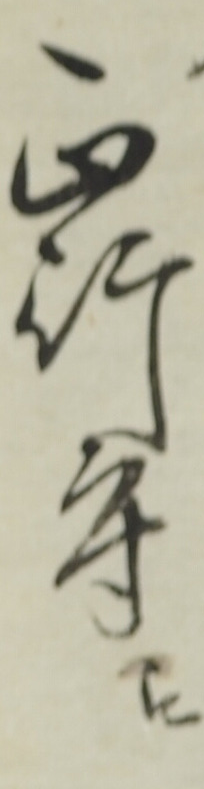正行守江
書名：遊行上人様御札守被下候留書
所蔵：伊那市立高遠町図書館・合同会社AMANE
